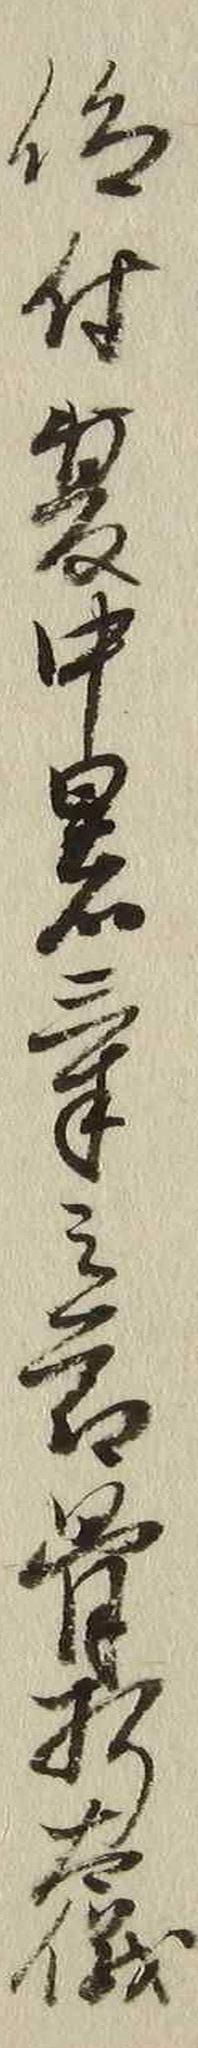仰付夏中暑気之節骨折太儀
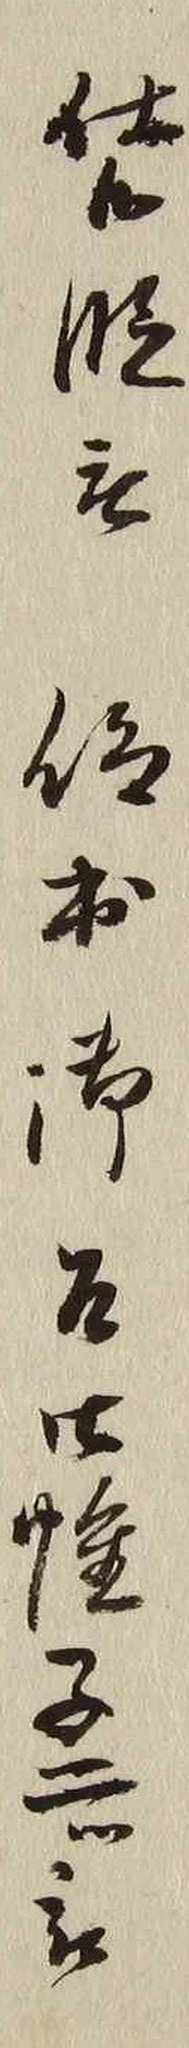仕候段被仰出御召帷子二ツ被
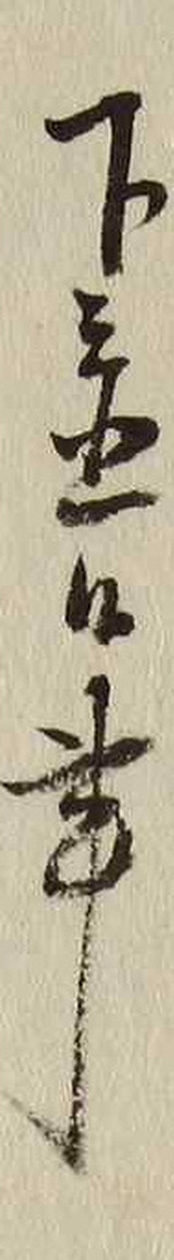下置候事
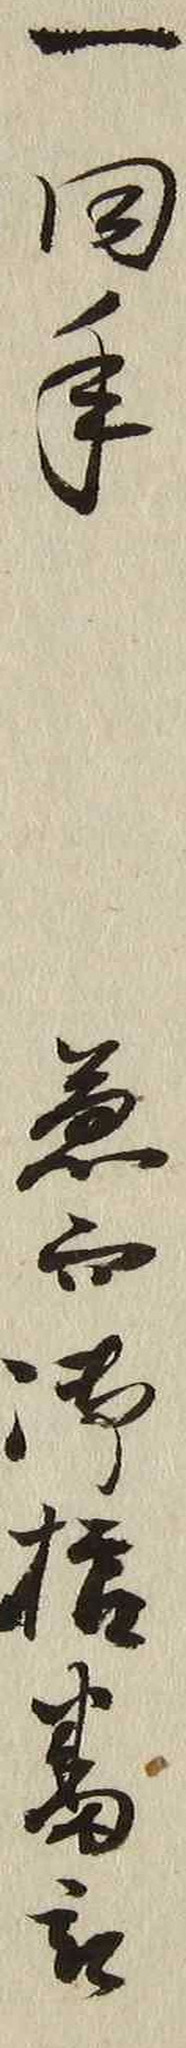一同年兼而御櫛番被
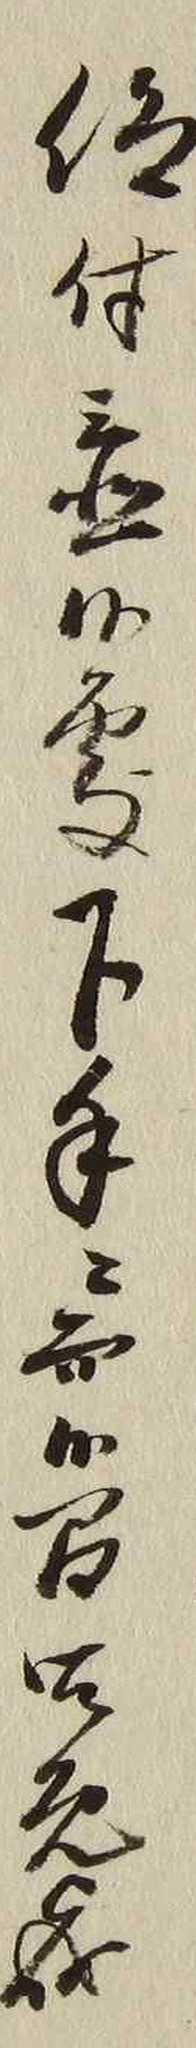仰付置候処下手ニ而候間御免被成
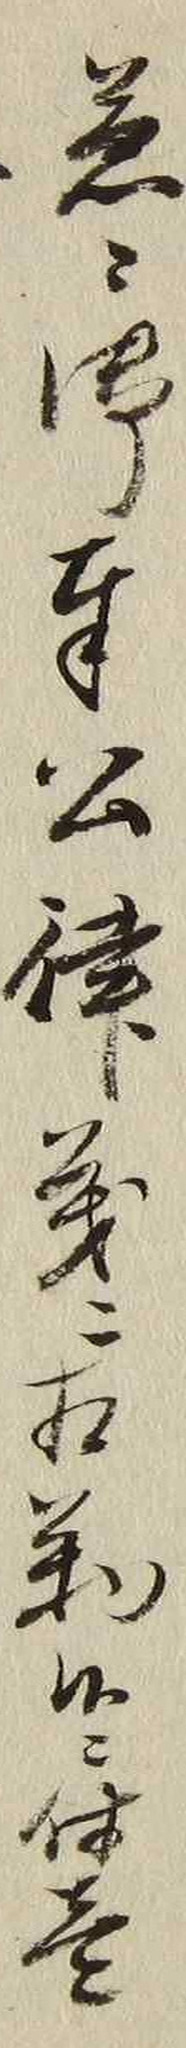兼而御奉公律義ニ相勤候ニ付壱
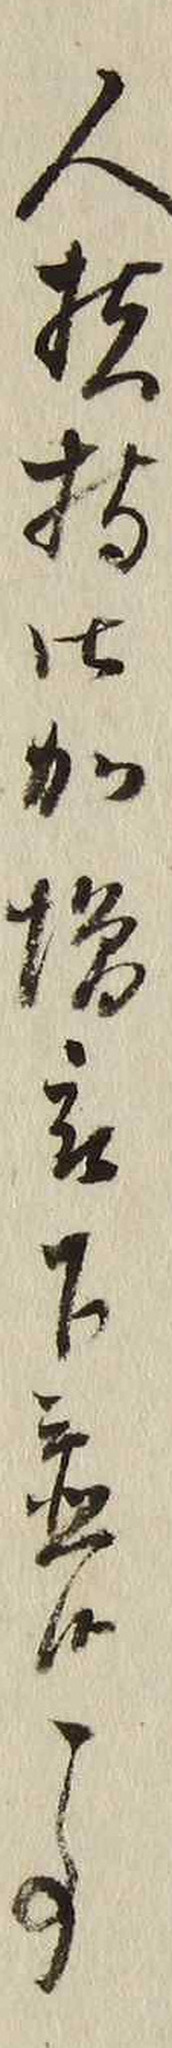人扶持御加増被下置候事
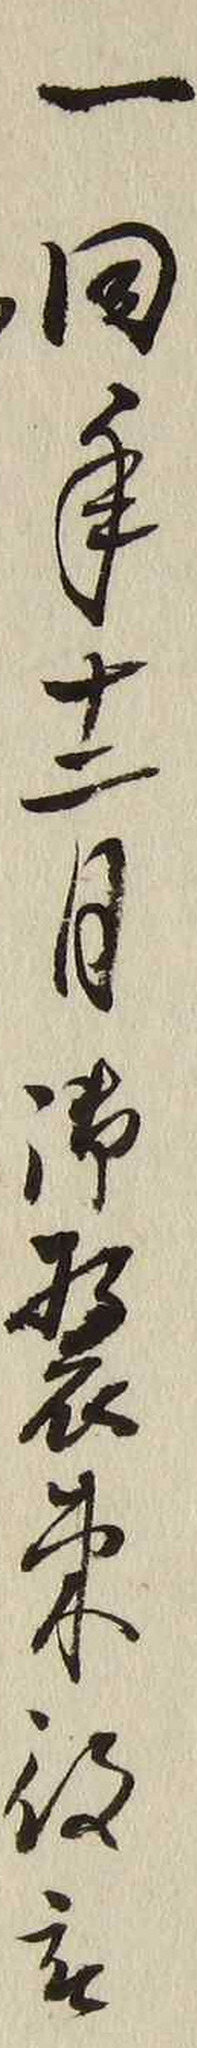一同年十二月御装束役被
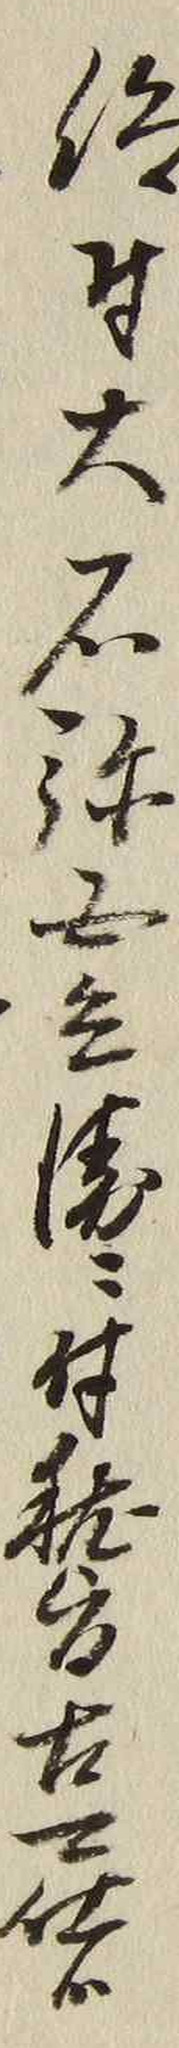仰付大石弥五兵衛ニ付稽古相仕候
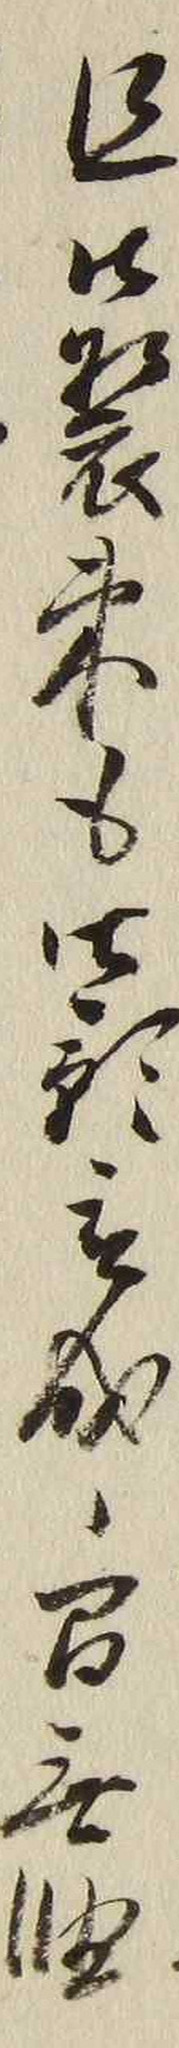且御装束も御預被成候間無油
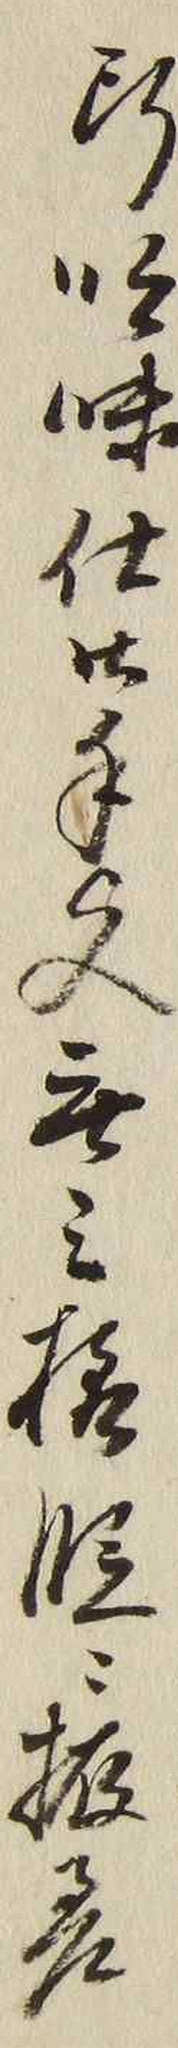断吟味仕御手支無之様段々拵差

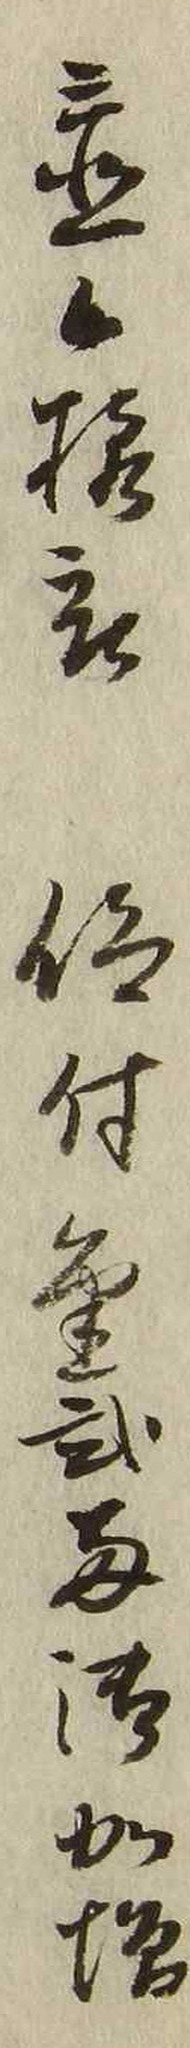置候様被仰付金弐両御加増
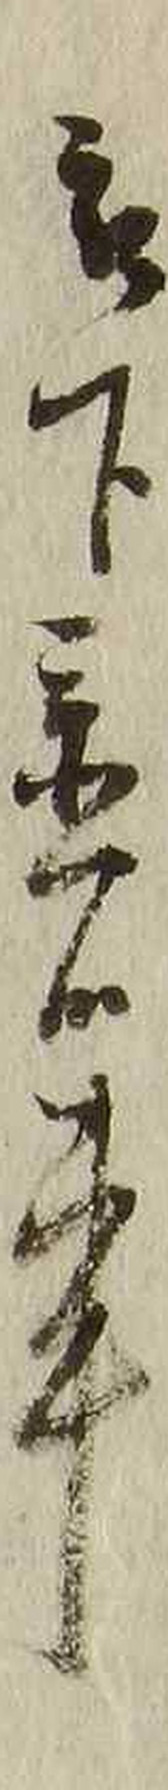被下置候事
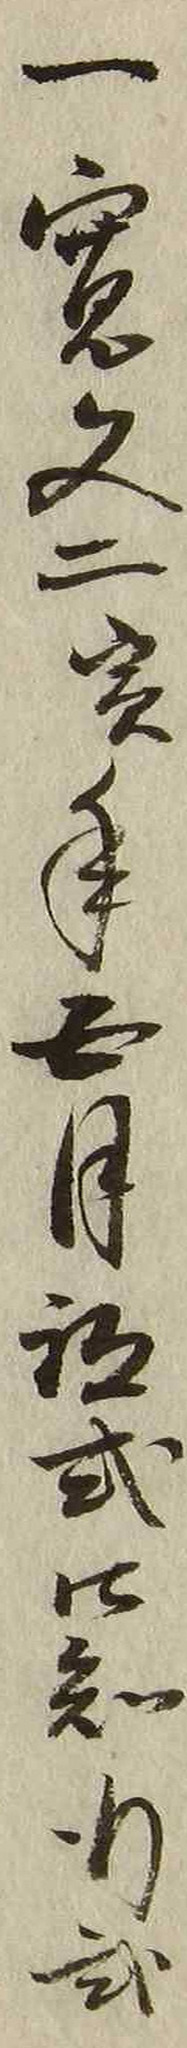一寛文二寅年五月跡式御知行弐
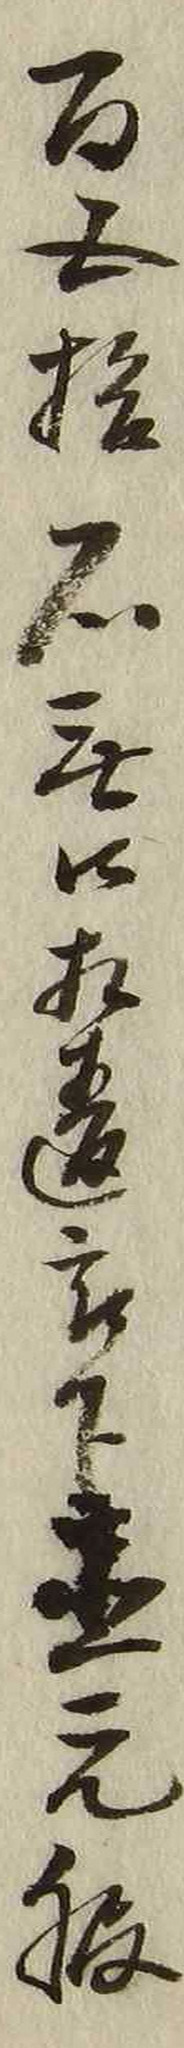百五拾石無御相違被下置元服
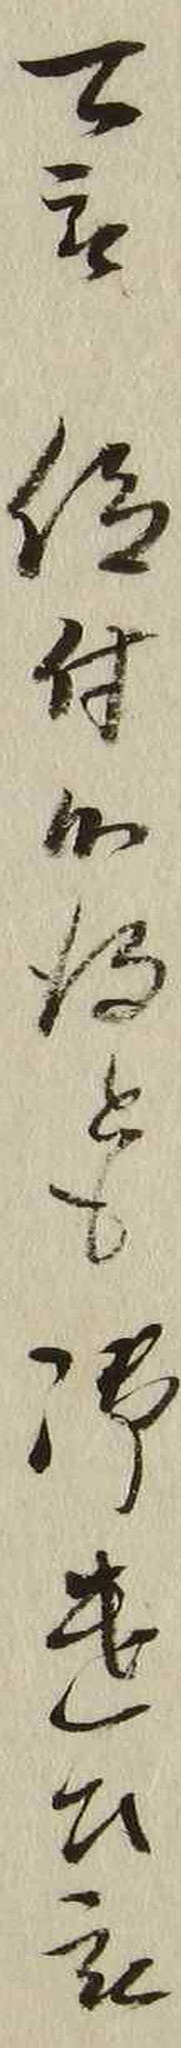可被仰付候得とも御遣ひ被
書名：諸士系譜　巻之355　す之部5
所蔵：会津若松市立会津図書館
